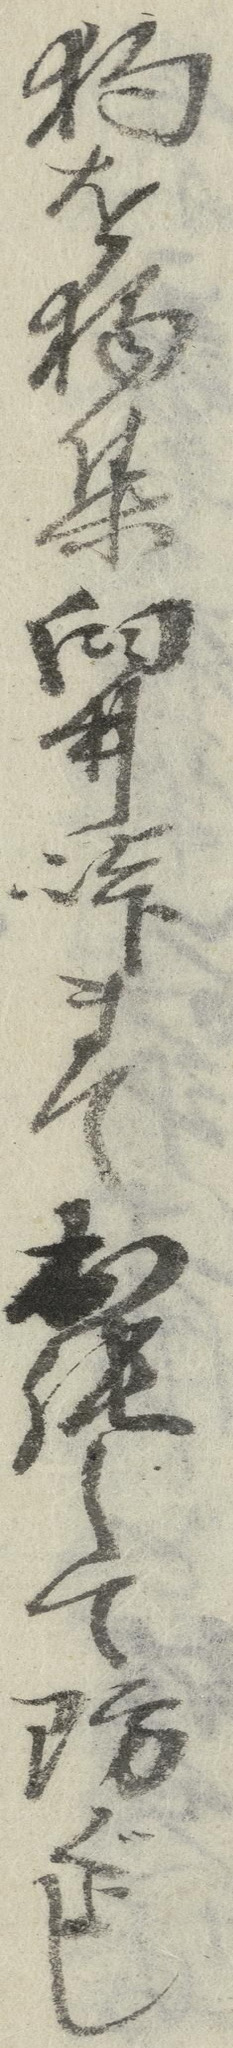狗を独集臼井峠まて出張して防ぐよし
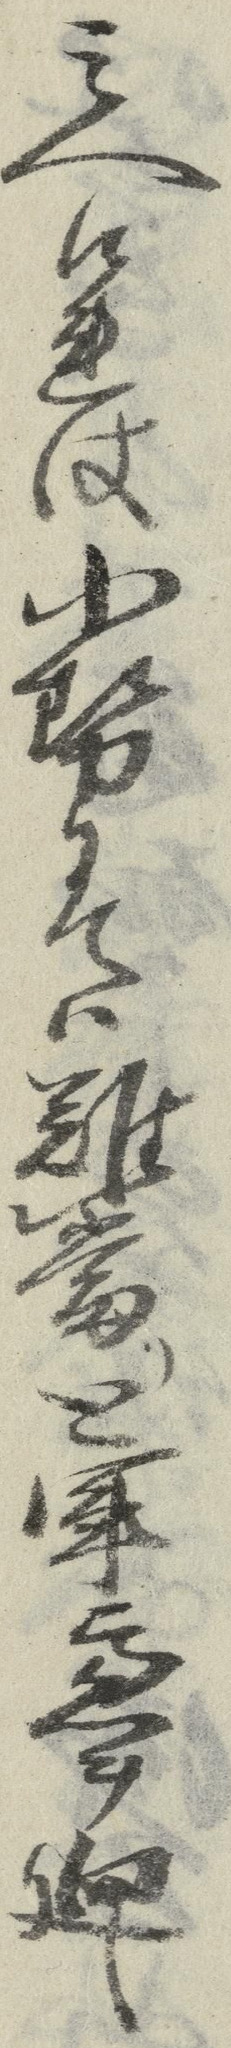みへけれは小勢にては難当軍慮ヲ廻し
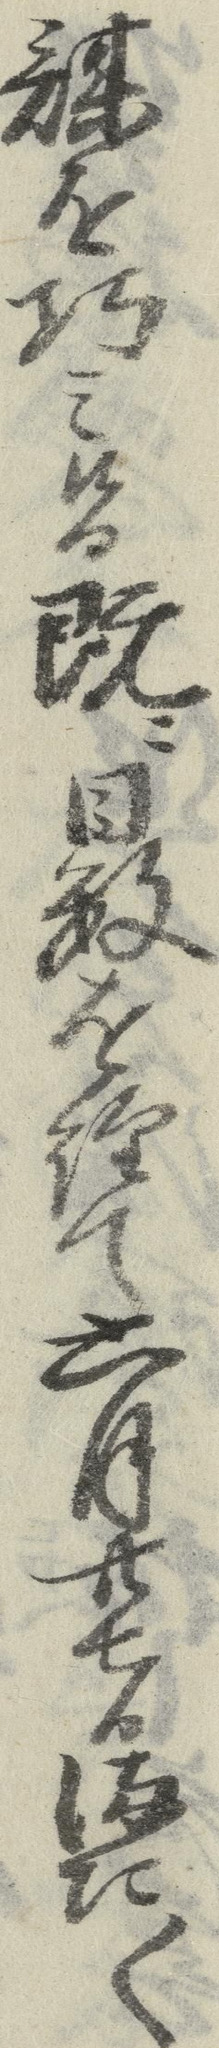謀を巧みける既に日数を経て六月廿七日また〳〵
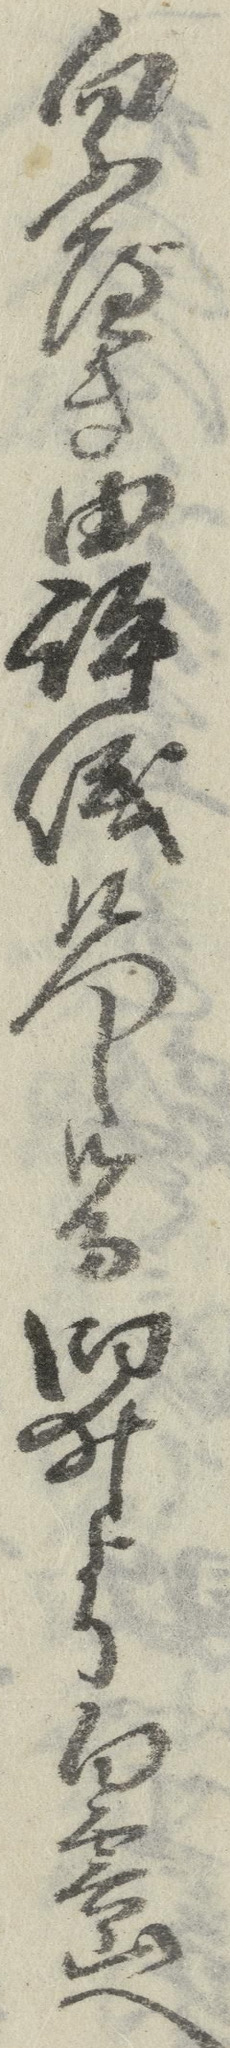向ふべき由評議けつしける臼井より白雲山へ
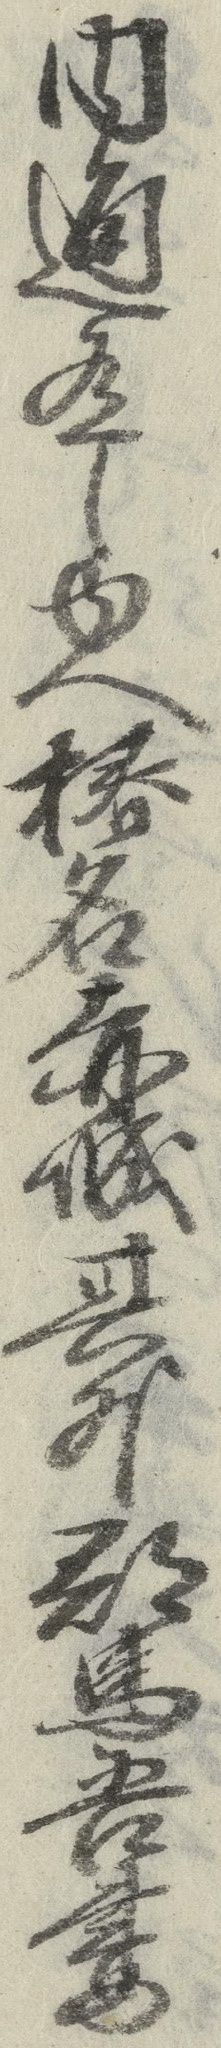内通有しゆへ榛名赤城其外郡馬吾妻
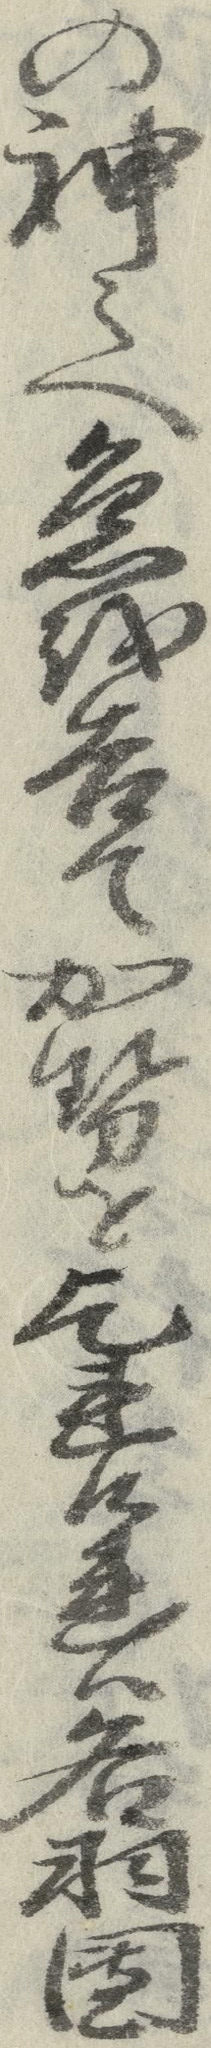の神々へ急を告て加勢を乞れけれは各羽団
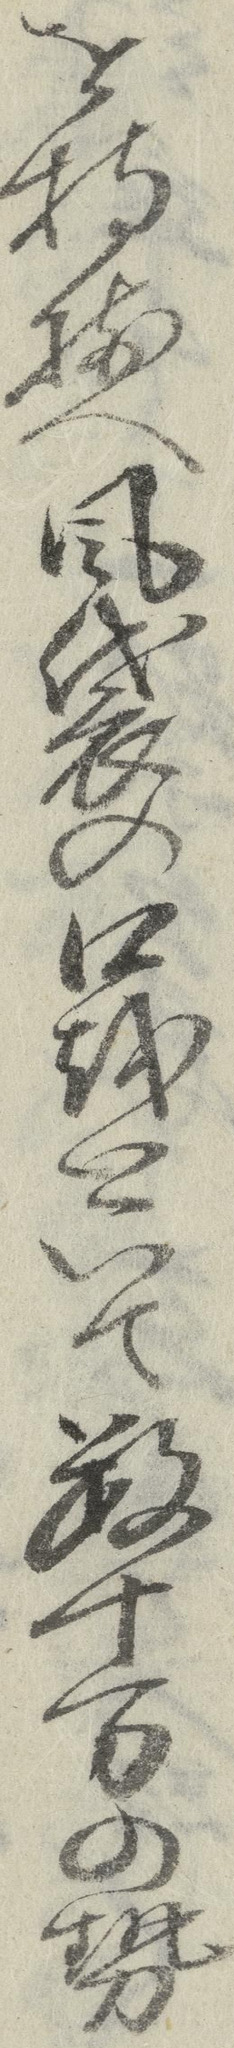を持揃へ風袋の口をといて数十万の勢
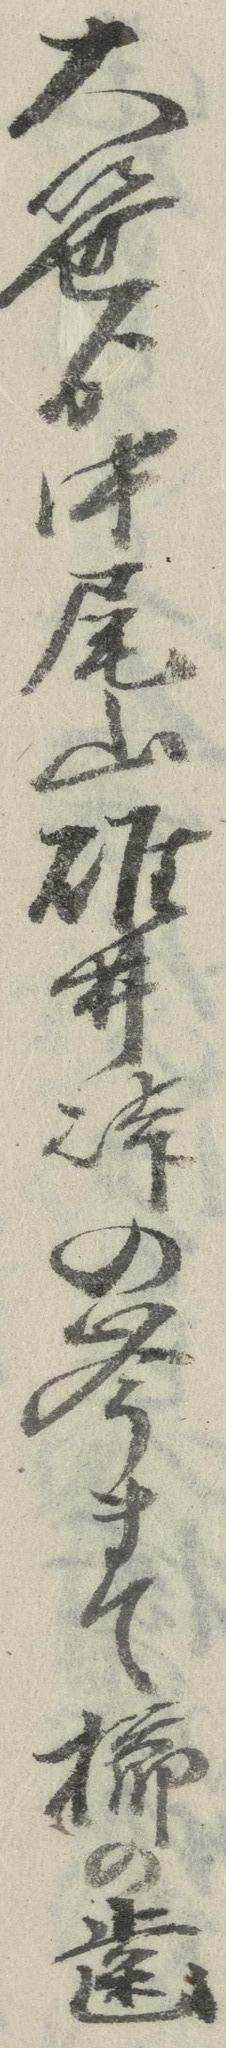大笹ゟ中尾山碓井峠の岑まて櫛の歯
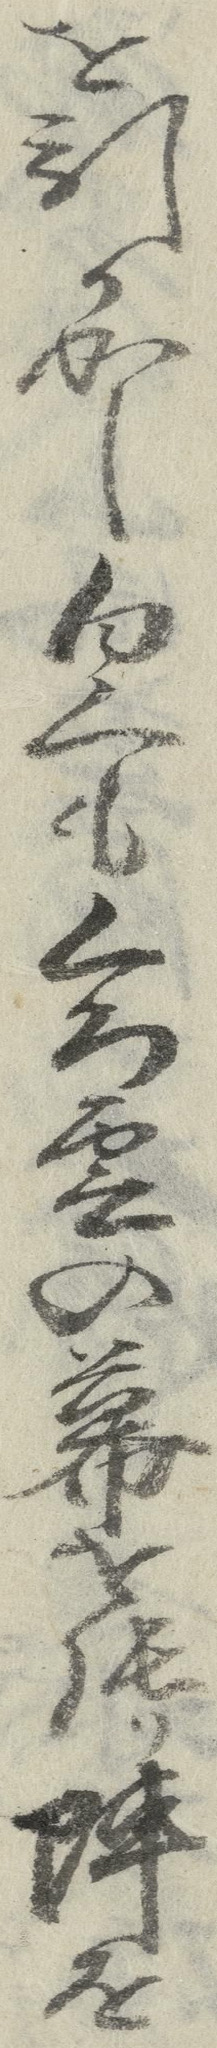を引か如し白くもくろ雲の幕を張り陣を
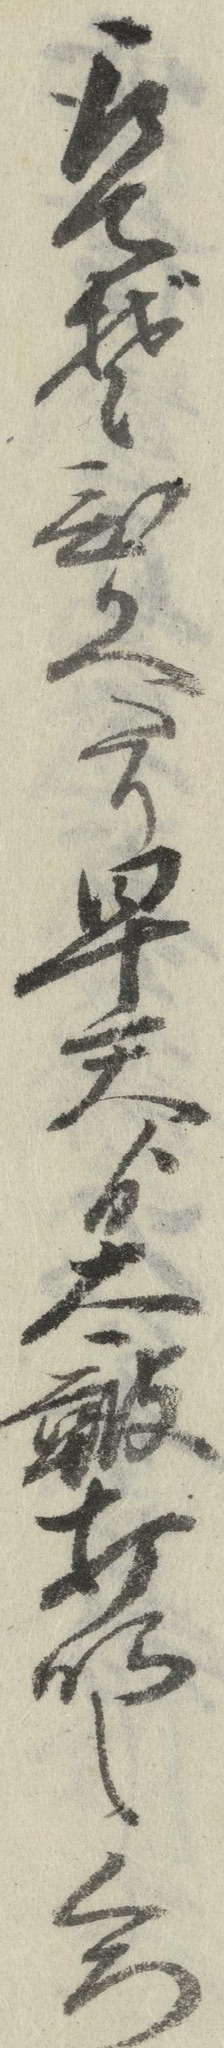取てぞひかへたり早天ゟ太鼓打鳴しくろ

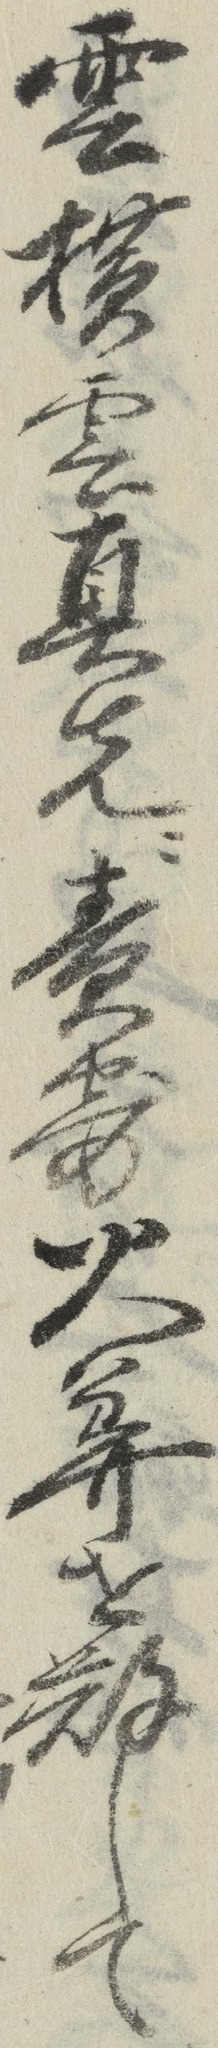雲横雲真先に責寄火華を散して
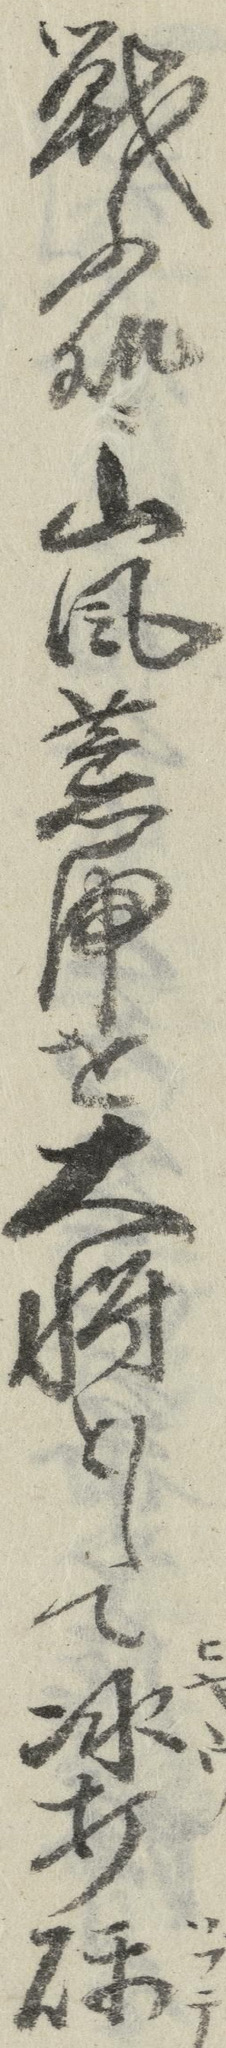戦ふ処に山風荒神を大将として冰打礫
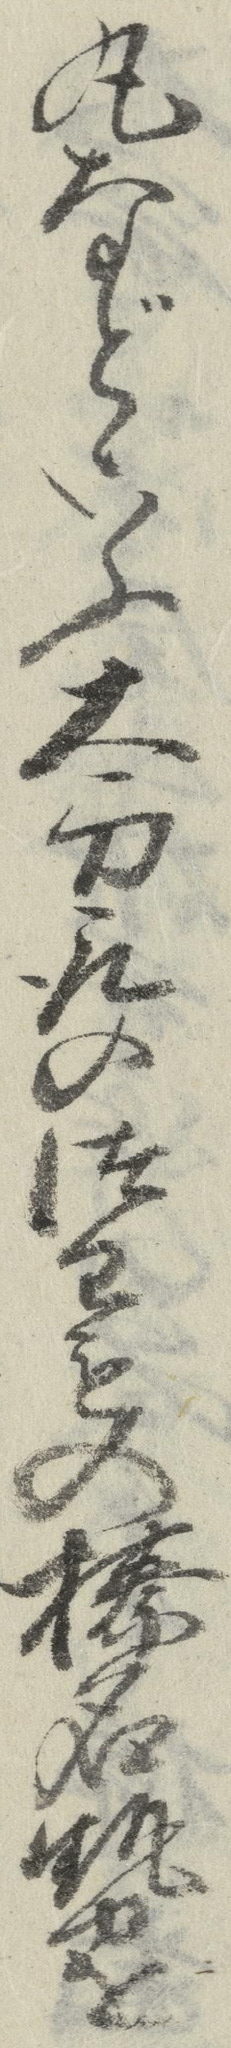丸などゝいふ太刀取のつわもの榛名勢を
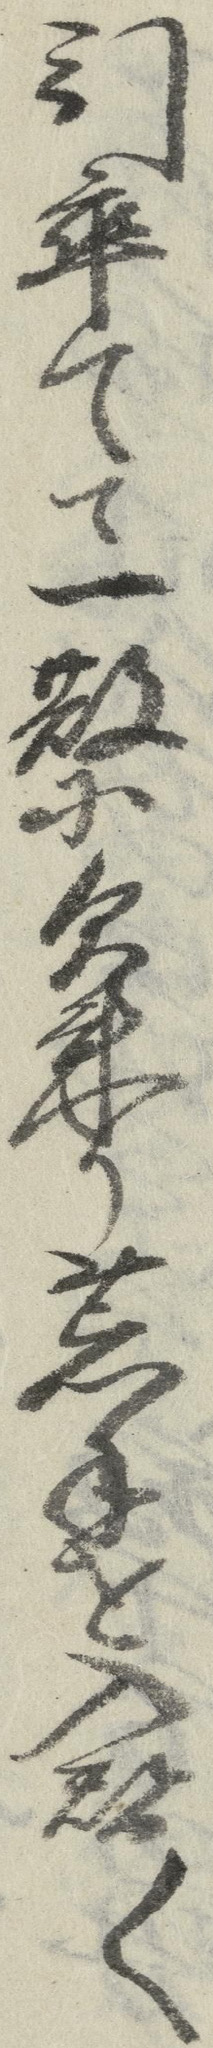引卒てて一散に欠来り荒手を入替〳〵
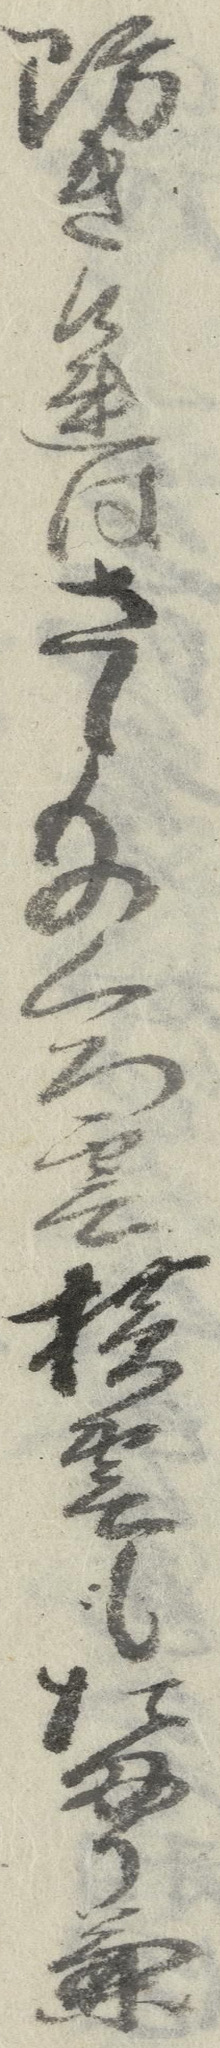防きけれはさしものくろ雲横雲もたまり兼
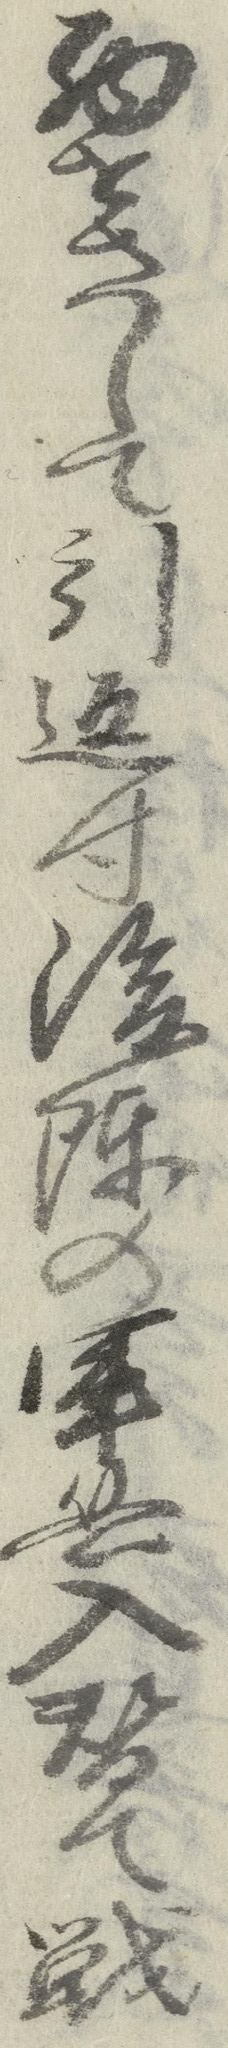西をさして引返す後陣の軍兵入替て戦
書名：浅間大焼騒動記　上
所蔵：東京大学地震研究所図書室 Earthquake Research Institute Library, The University of Tokyo, JAPAN
